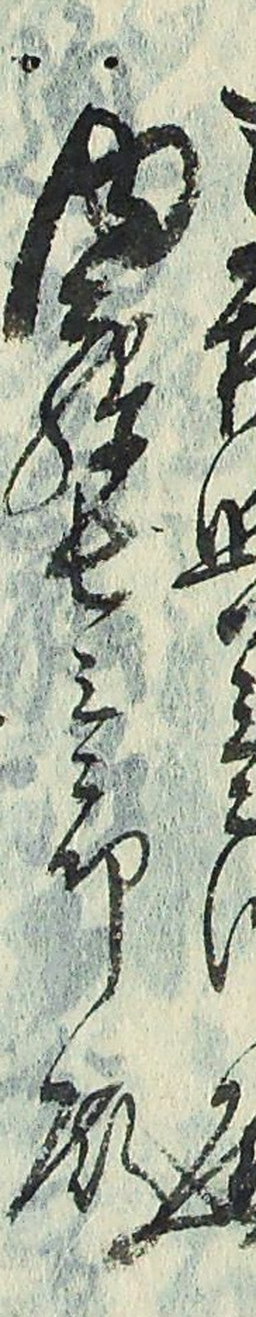内藤長三郎殿
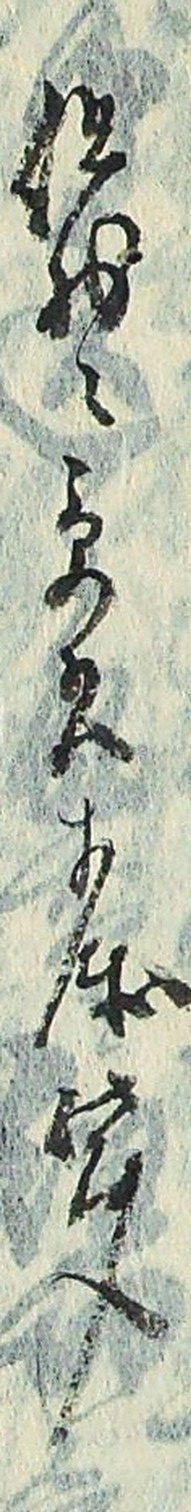但村々受書相添袋入

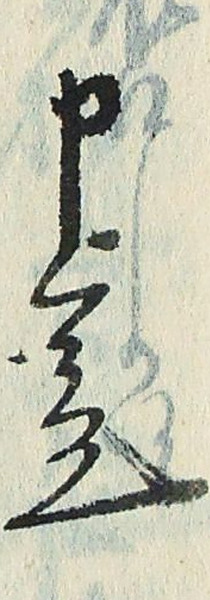申上覚
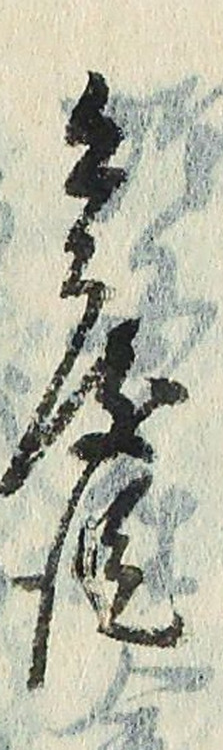今度従
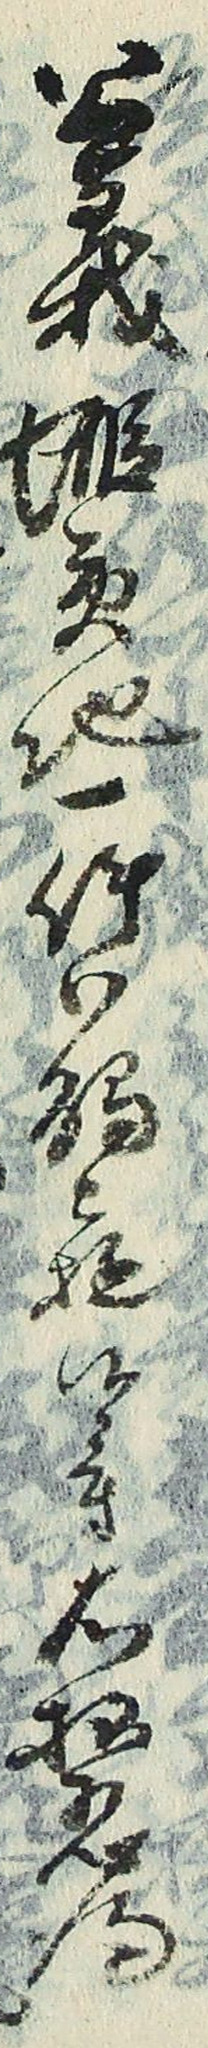公義蝦夷地一件御触被遊候に付右様相心得
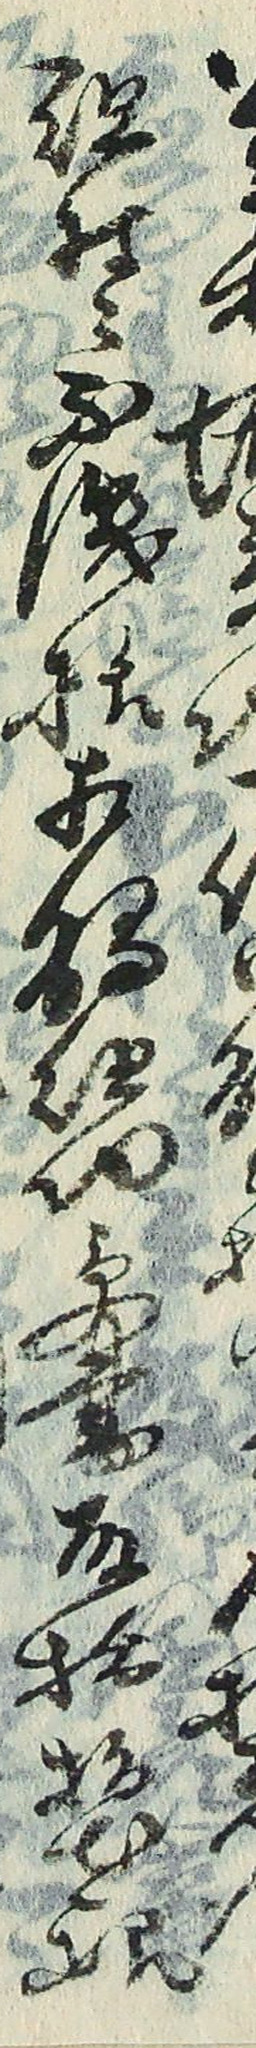組村々不洩様相触組切受書取揃指出候様
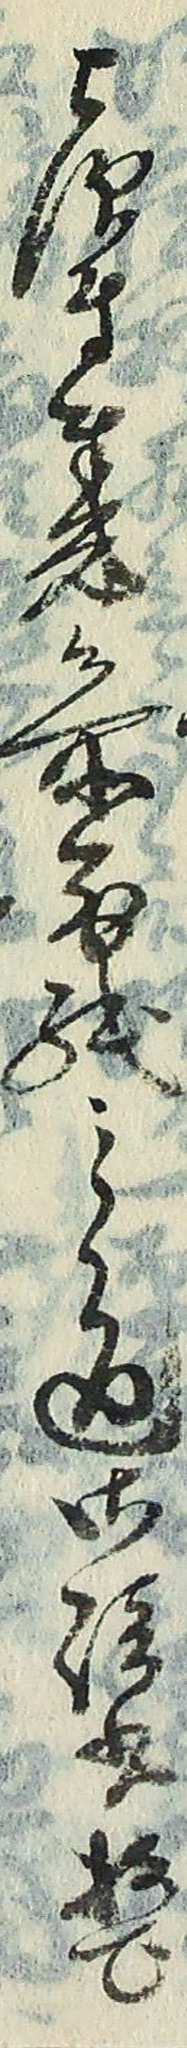被仰付奉畏候所別紙之通御請書指出
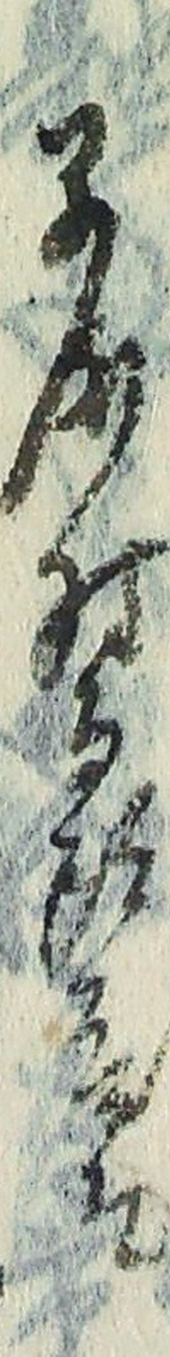早淵村与頭庄屋
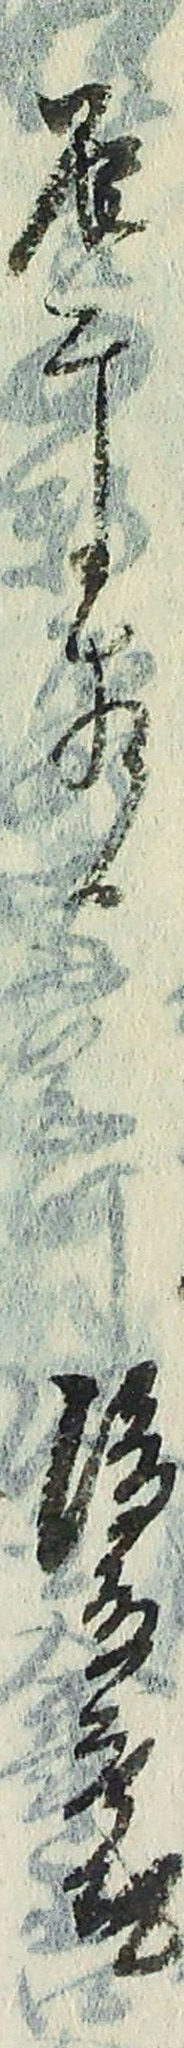辰二月十九日後藤庄助
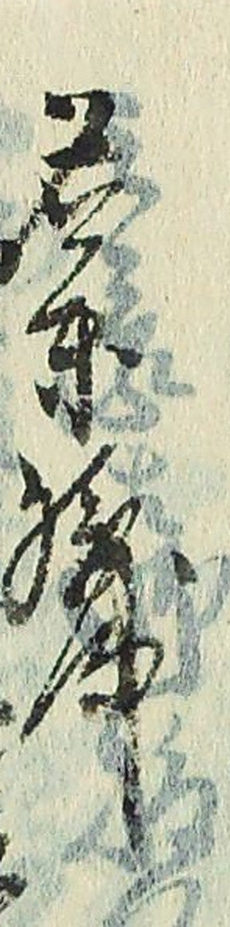名東勝浦
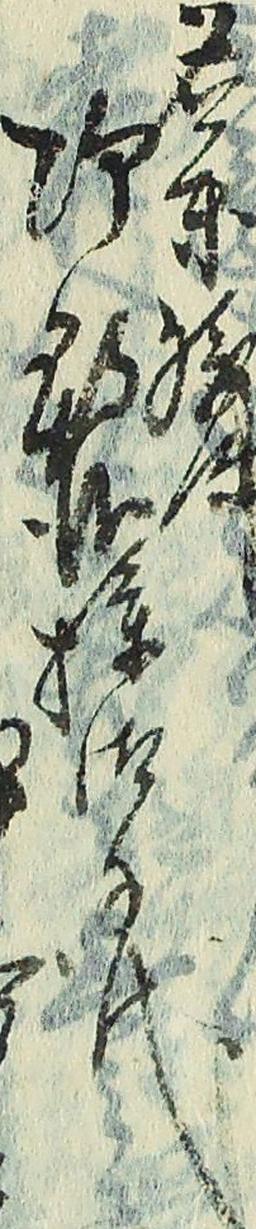御郡代様御手代
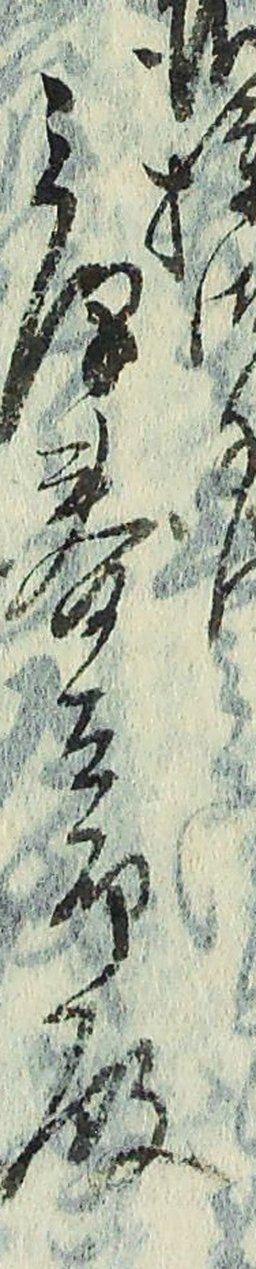三沢春太郎殿
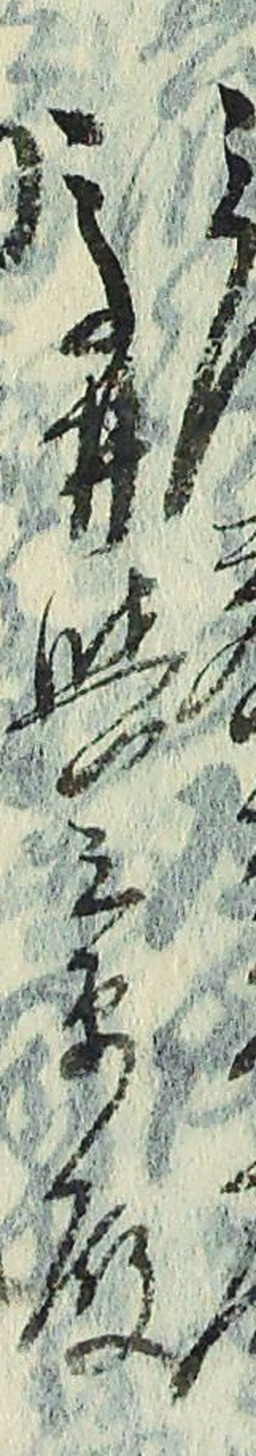高井与三兵衛殿
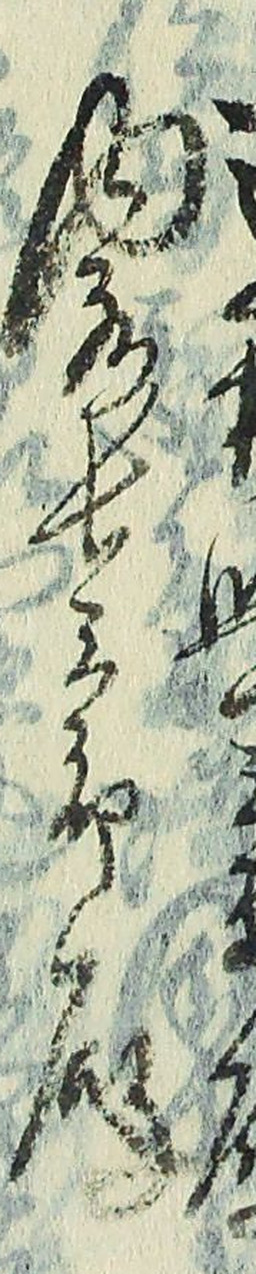内藤長三郎殿
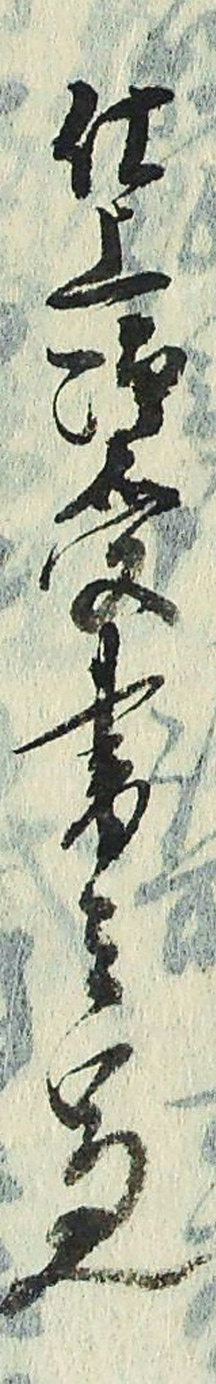仕上御受書之覚
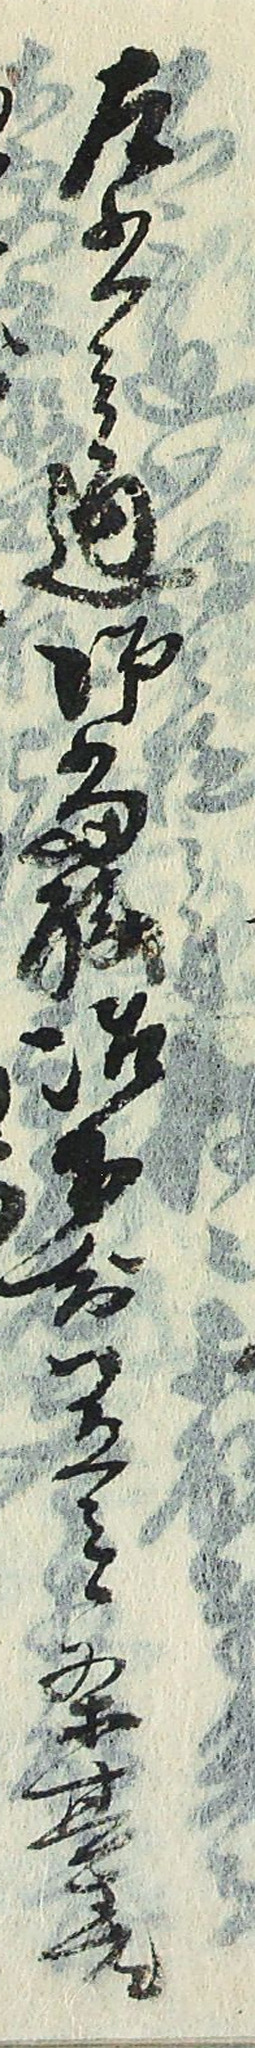左書之通御当職御下知有之候条其方共
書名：諸御用御□受書控
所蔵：鳴門教育大学 Naruto University of Education
